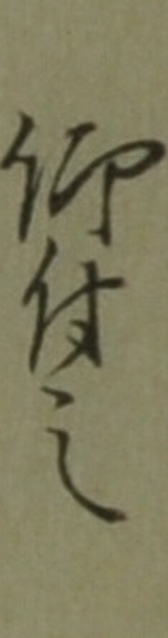仰付之
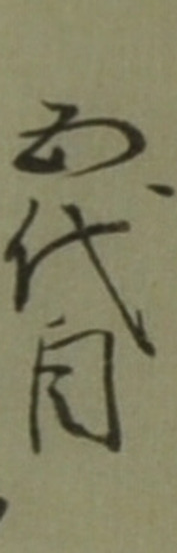五代目
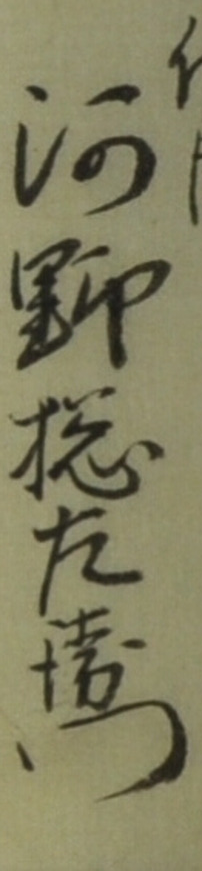河野捴左衛門

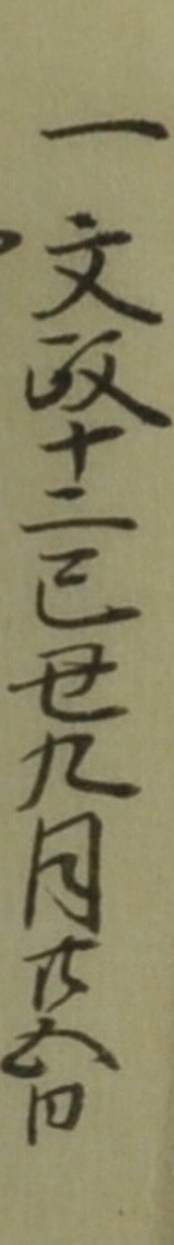一文政十二己丑九月廿五日
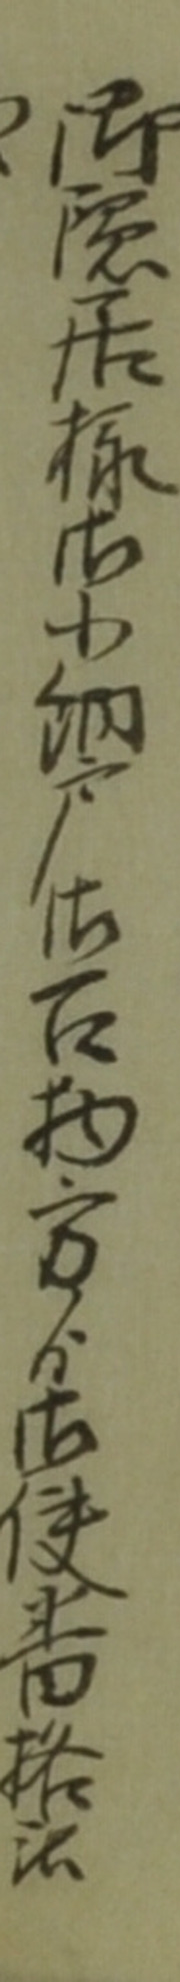御隠居様御小納戸御召物方ゟ御使番格被
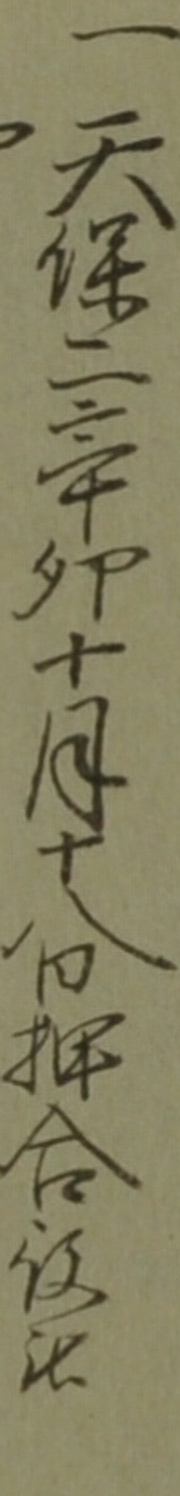一天保二辛卯十月十八日押合役被
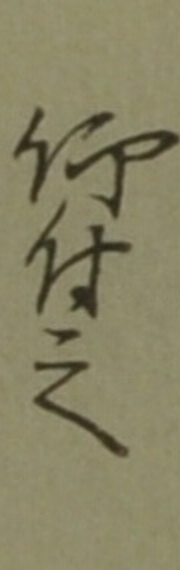仰付之
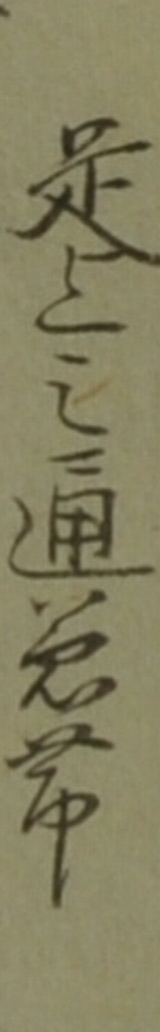是迄之通兼帯
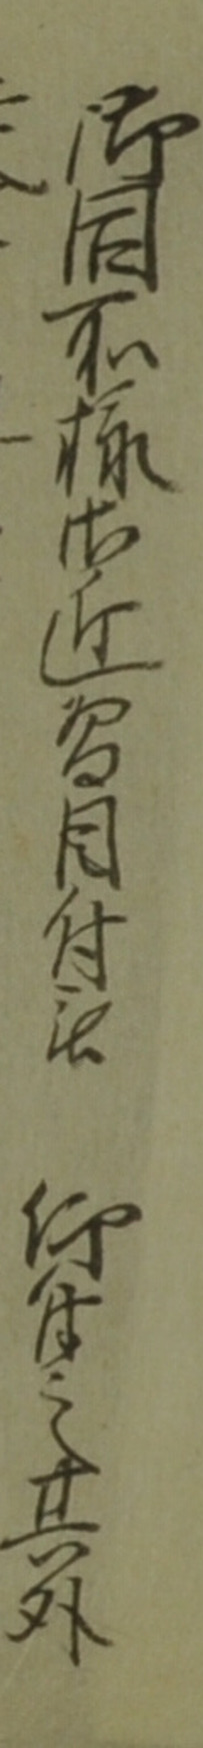御同所様御近習目付被仰付之其外
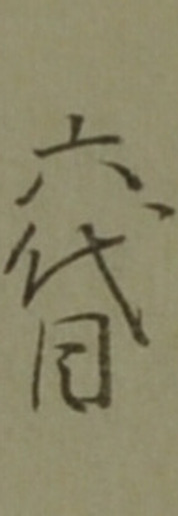六代目
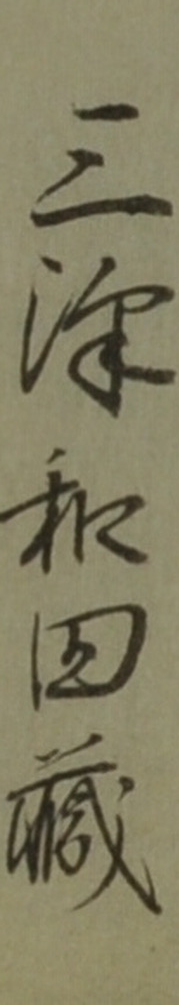三沢和田蔵
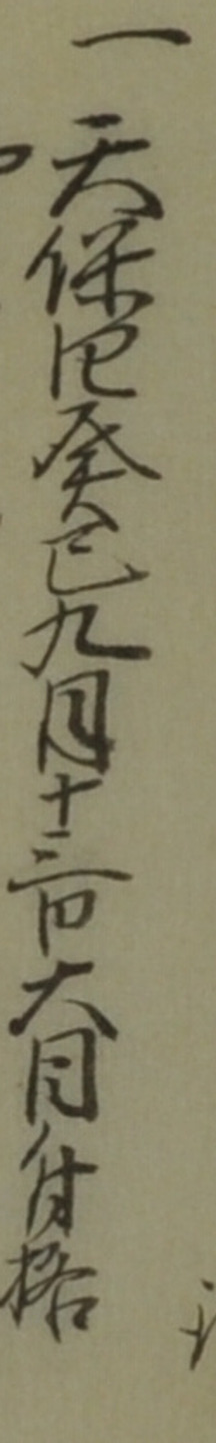一天保四癸巳九月十三日大目付格
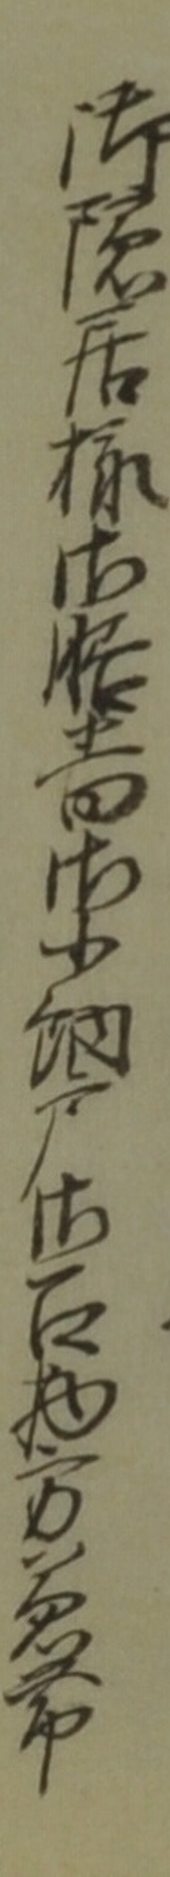御隠居様御膳番御小納戸御召物方兼帯
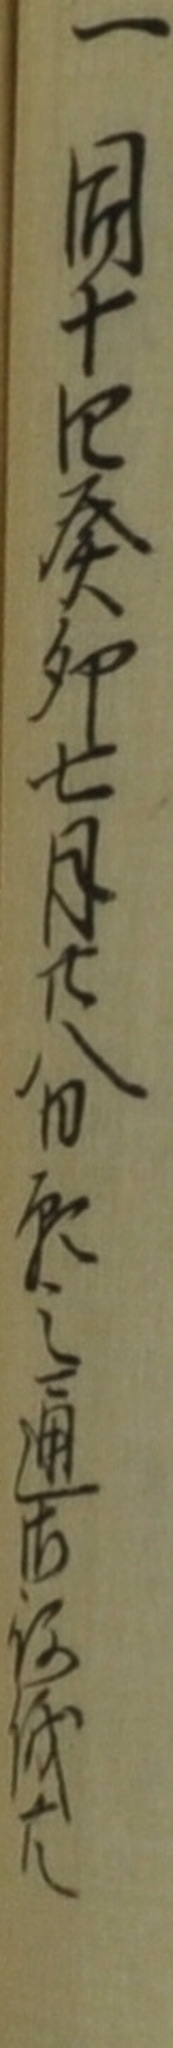一同十四癸卯七月廿八日願之通御役儀共
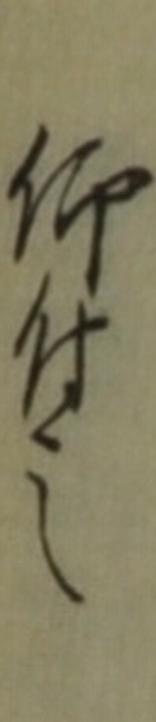仰付之
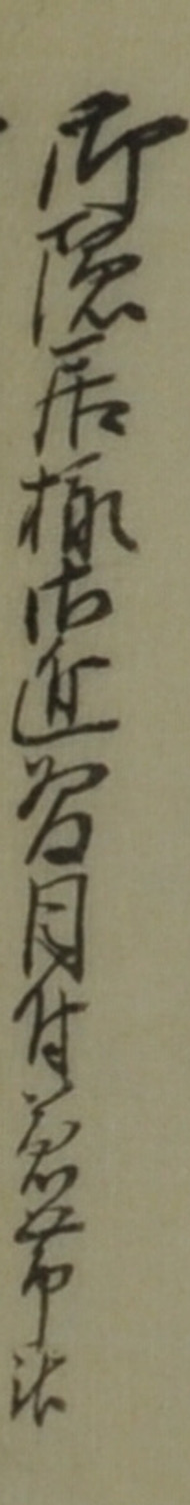御隠居様御近習目付兼帯被
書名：諸御役代々録（四）
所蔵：伊那市立高遠町図書館・合同会社AMANE
